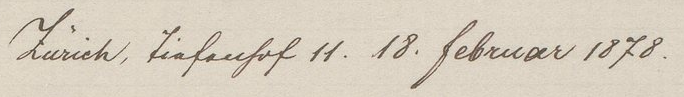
Zürich, Tiefenhof 11. 18. Februar 1878
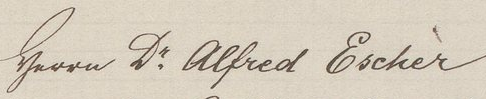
Herrn Dr Alfred Escher
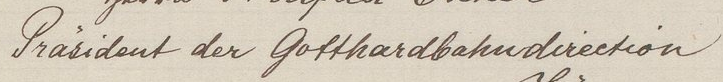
Präsident der Gotthardbahndirection
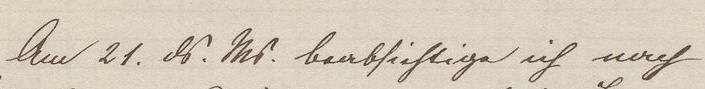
Am 21. ds. Ms. beabsichtige ich nach
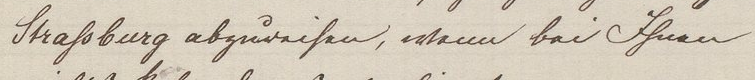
Strassburg abzureisen, wenn bei Ihnen
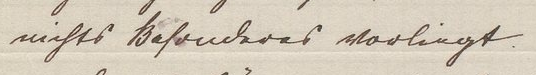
nichts Besonderes vorliegt.
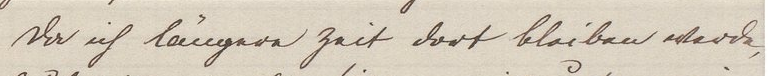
Da ich längere Zeit dort bleiben werde,
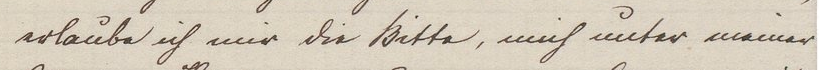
erlaube ich mir die Bitte, mich unter meiner
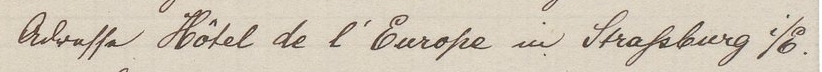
Adresse Hôtel de l'Europe in Strassburg i/E.
